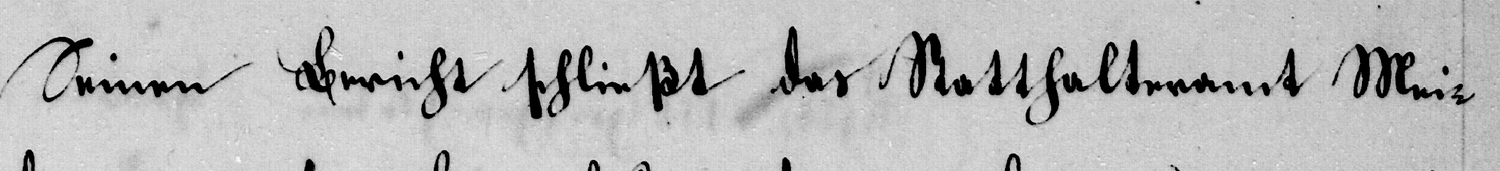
Seinen Bericht schließt das Statthalteramt Mei¬
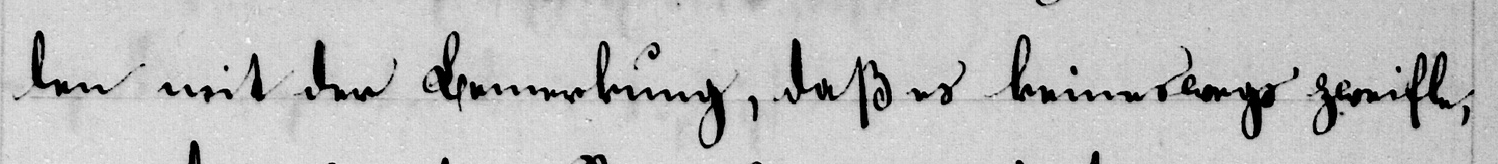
len mit der Bemerkung, daß es keineswegs zweifle,
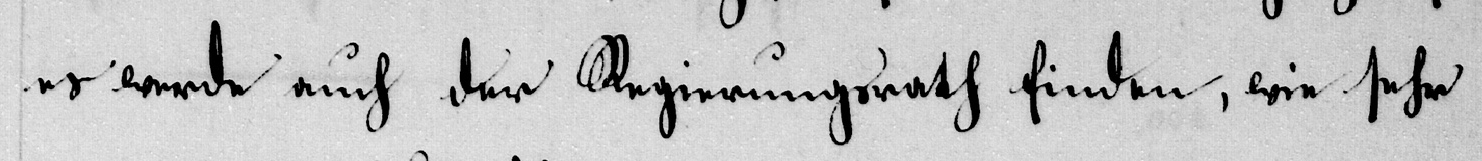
es werde auch der Regierungsrath finden, wie sehr
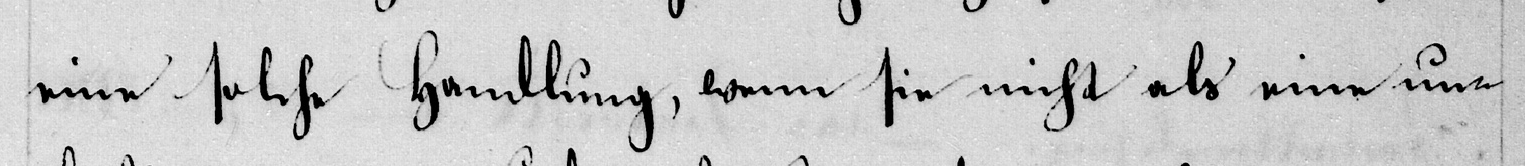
eine solche Handlung, wenn sie nicht als eine un¬
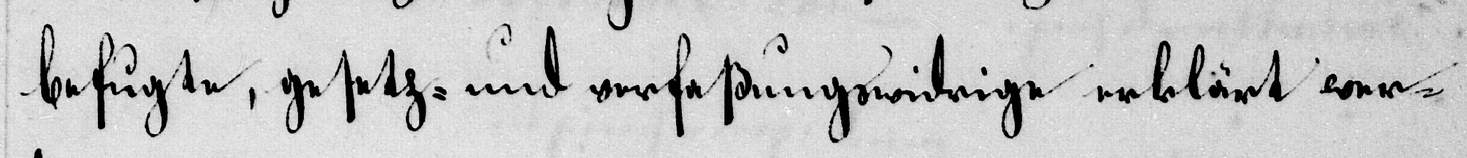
befugte, gesetz- und verfaßungswidrige erklärt wer¬
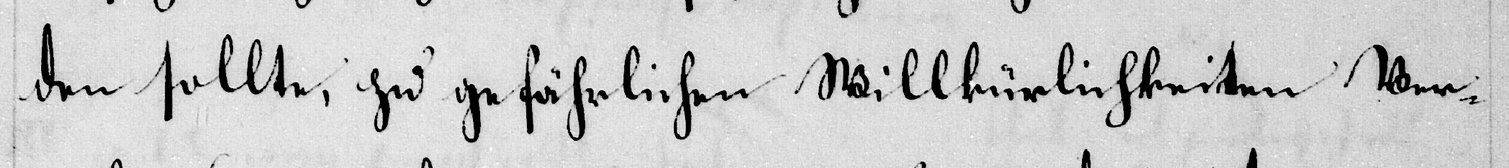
den sollte, zu gefährlichen Willkürlichkeiten Ver¬
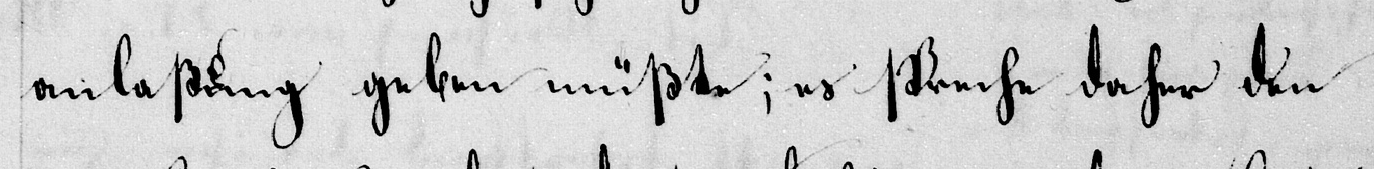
anlaßung geben müßte; es spreche daher den
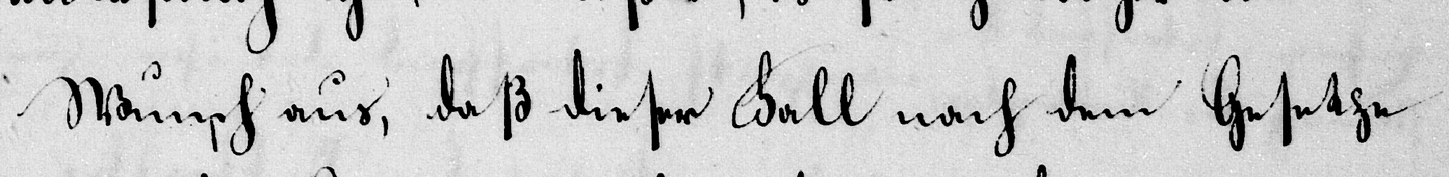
Wunsch aus, daß dieser Fall nach dem Gesetze
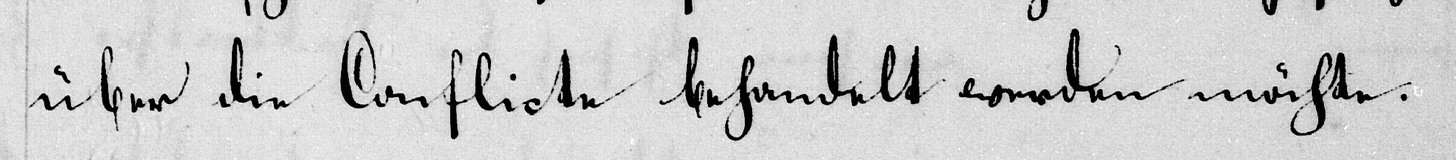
über die Conflicte behandelt werden möchte.
